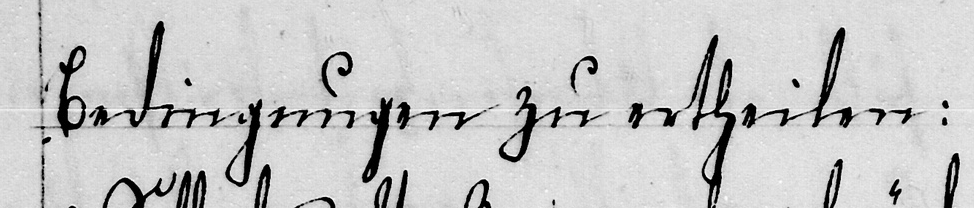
Bedingungen zu ertheilen:
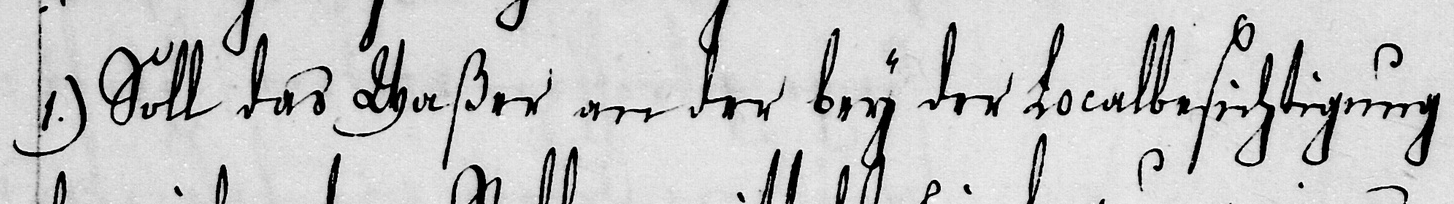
1.) Soll das Waßer an der bey der Localbesichtigung
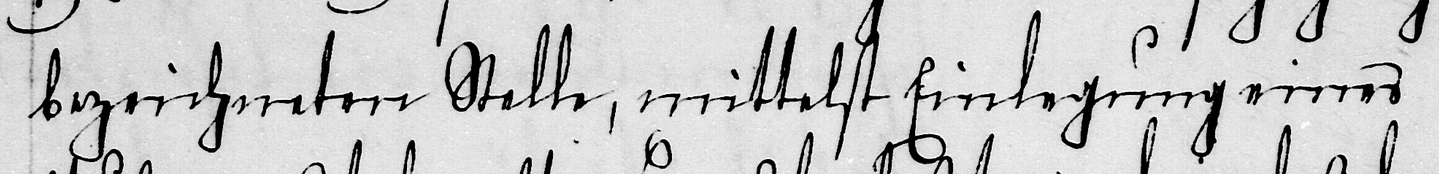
bezeichneten Stelle, mittelst Einlegung eines
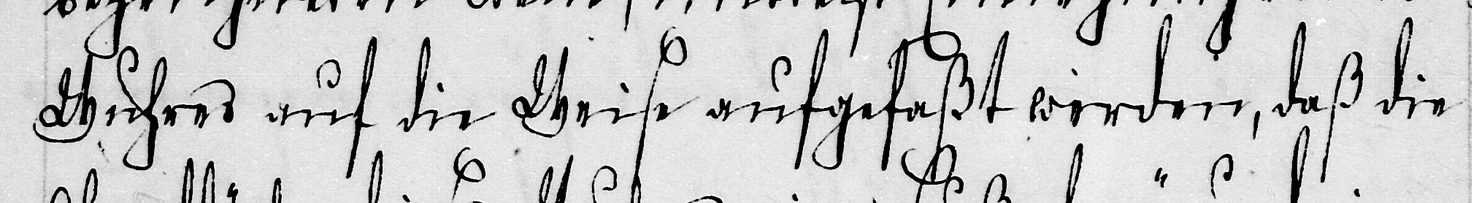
Wuhres auf die Weise aufgefaßt werden, daß die
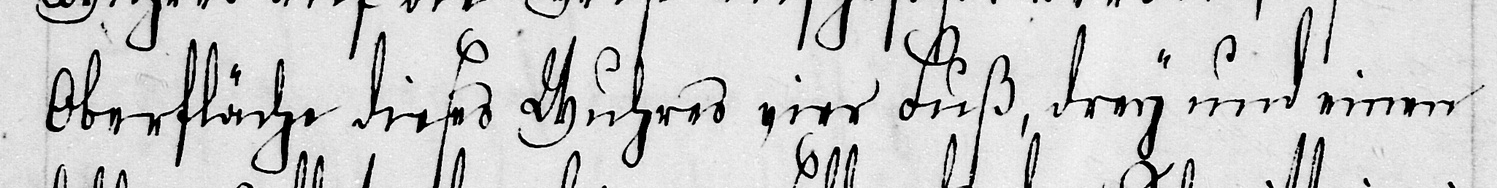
Oberfläche dieses Wuhres vier Fuß, drey und einen
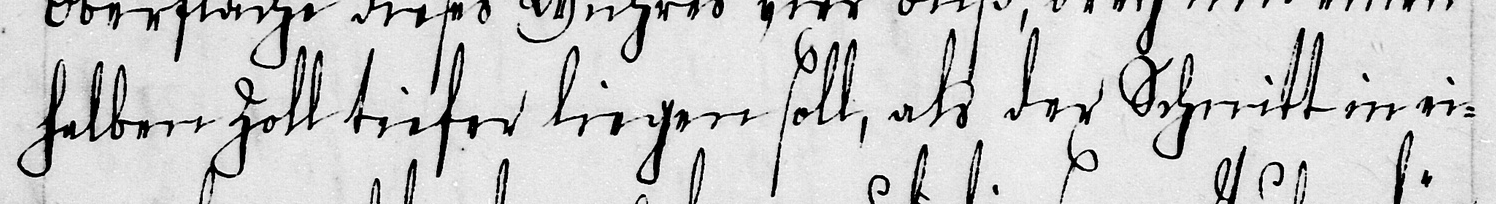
halben Zoll tiefer liegen soll, als der Schnitt in ei¬
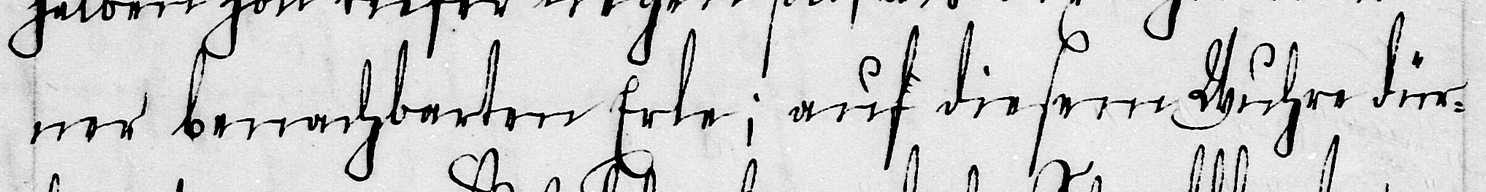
ner benachbarten Erle; auf diesem Wuhre dür¬
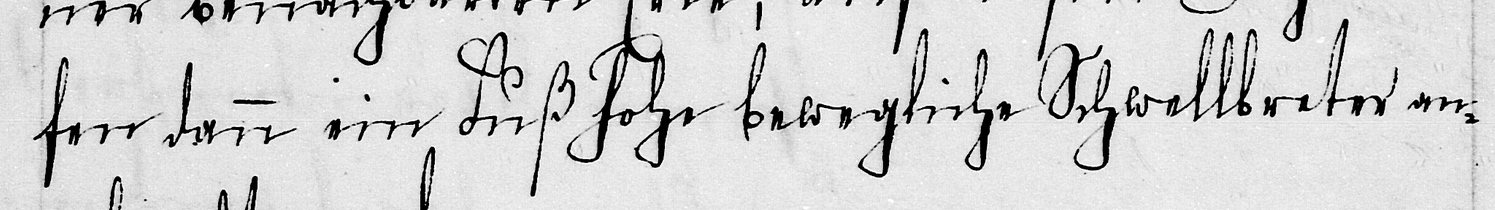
fen dann ein Fuß hohe bewegliche Schwellbreter an¬
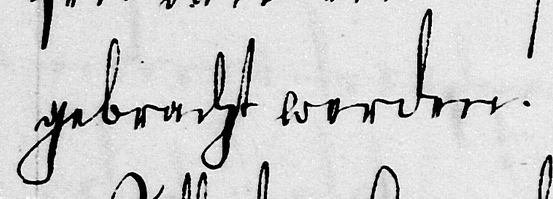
gebracht werden.
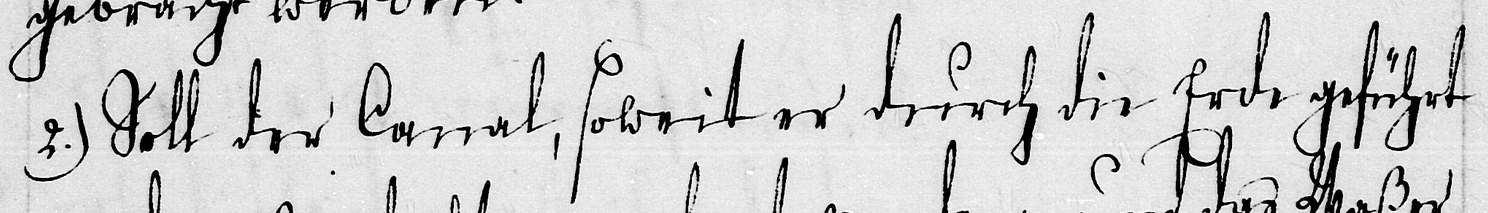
2.) Soll der Canal, soweit er durch die Erde geführt
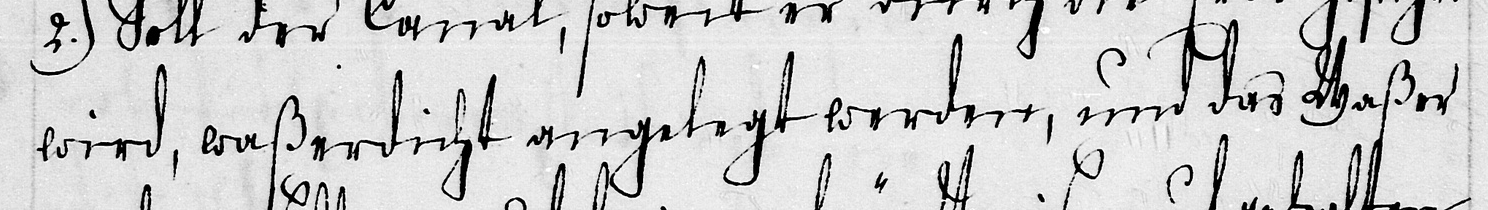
wird, waßerdicht angelegt werden, und das Waßer
